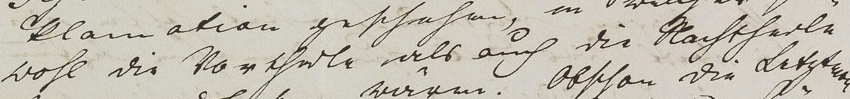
wohl die Vortheile als auch die Nachtheile
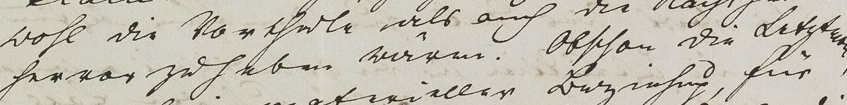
hervorzuheben wären. Obschon die Letztern
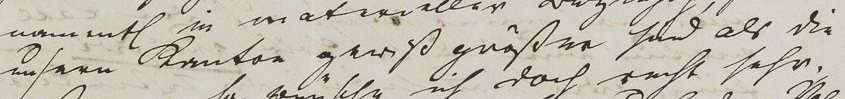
unsern Kanton gewiß größer sind als die
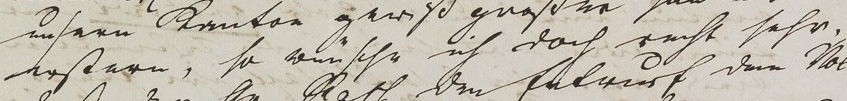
erstern, so wünsche ich doch recht sehr,
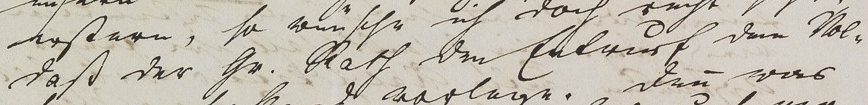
daß der Gr. Rath den Entwurf dem Vol-
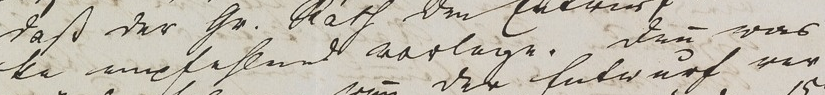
ke empfehlend vorlege. Denn was
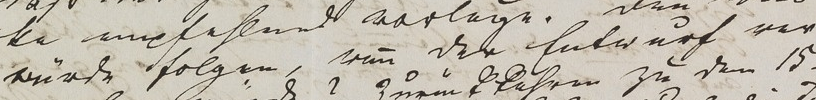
würde folgen, wenn der Entwurf ver-
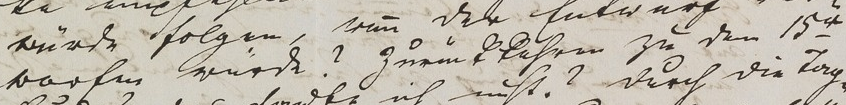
worfen würde? Zurückkehren zu dem 15er
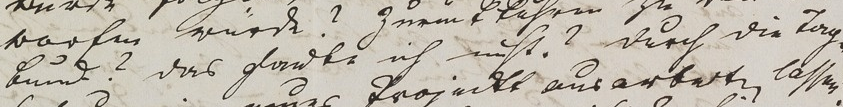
Bund? Das glaube ich nicht? Durch die Tag-
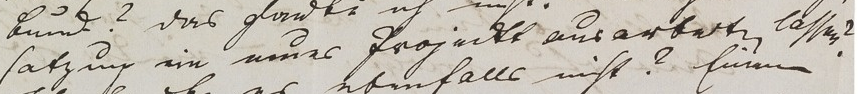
satzung ein neues Projeckt ausarbeiten lassen?
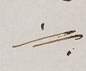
Einen
